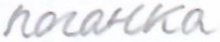поганка
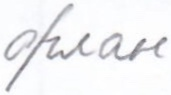орлан
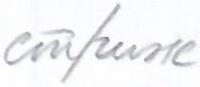стриж
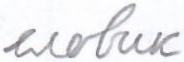еловик
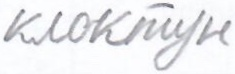клоктун
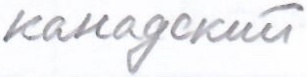канадский
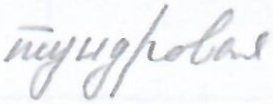тундровая
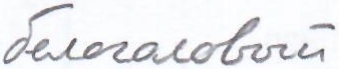белоголовый
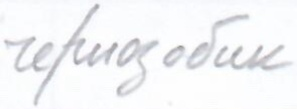чернозобик
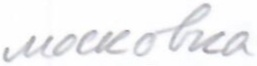московка
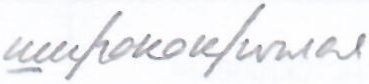ширококрылая
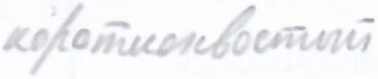короткохвостый
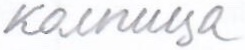колпица
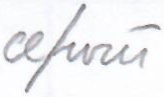серый
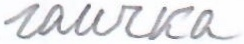гаичка
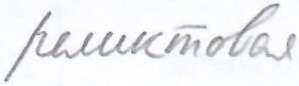реликтовая
